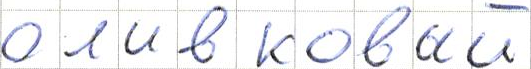оливковый
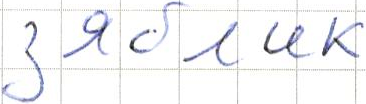зяблик
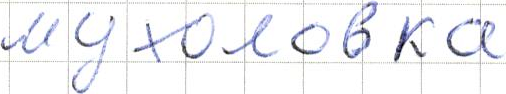мухоловка
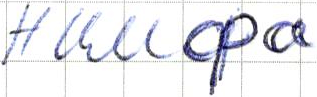нимфа
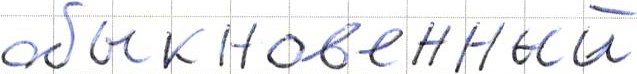обыкновенный
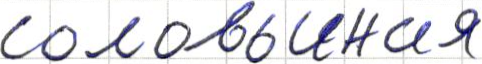соловьиная
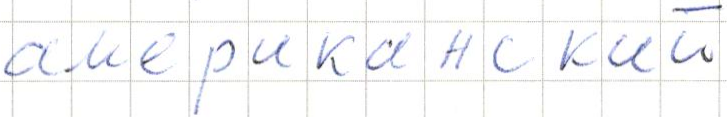американский
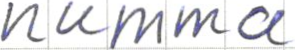питта
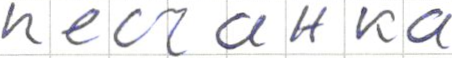песчанка
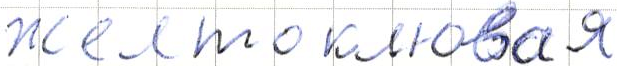желтоклювая
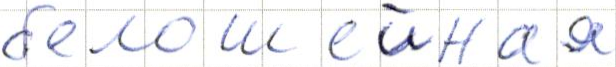белошейная
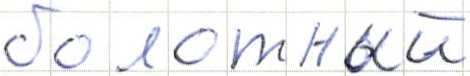болотный
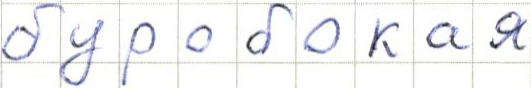буробокая
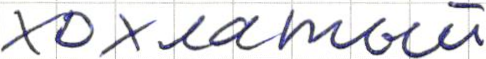хохлатый
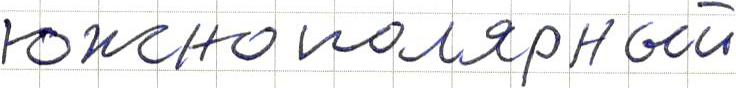южнополярный
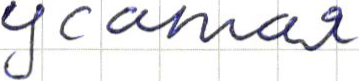усатая
